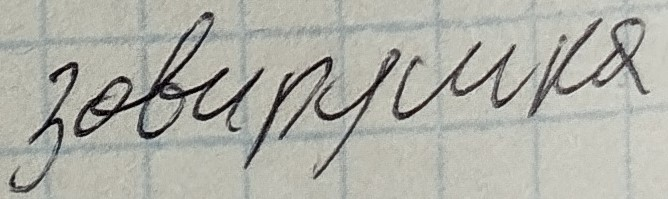зовирушка
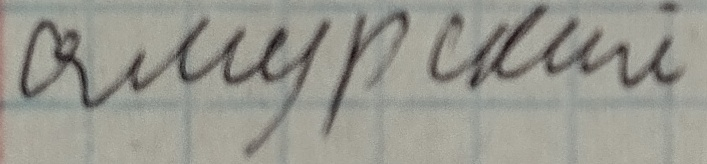амурский
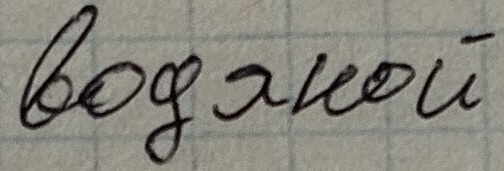водяной
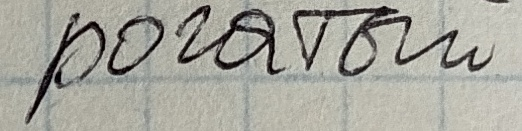рогатый
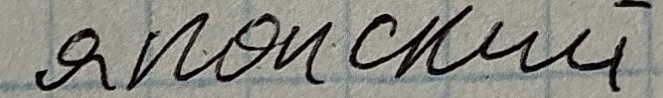японский
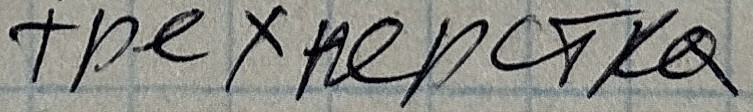трехперстка
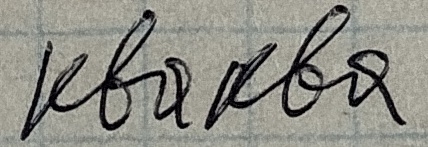кваква
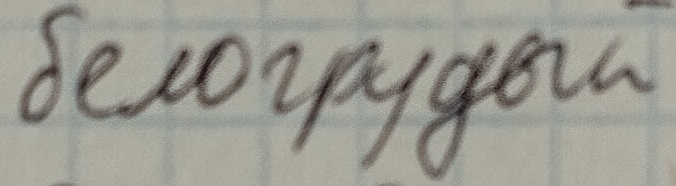белогрудый
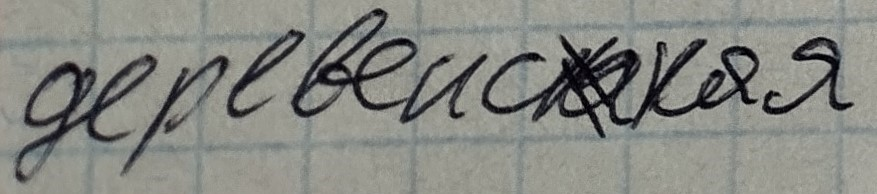деревенская
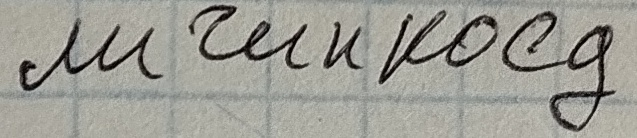личинкоед
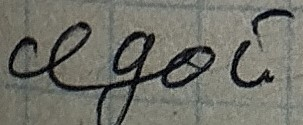седой
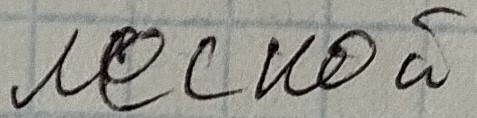лесной
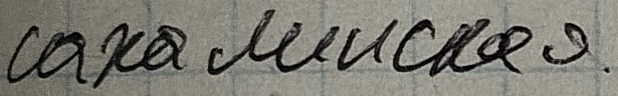сахалинская
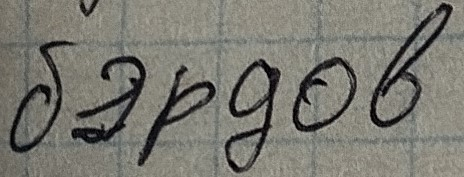бэрдов
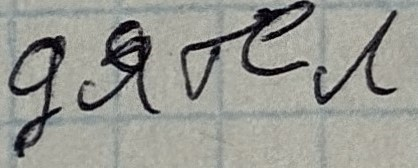дятел
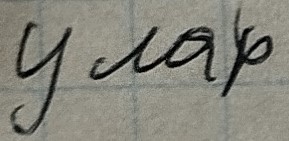улар
